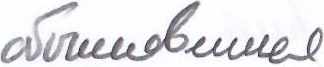обыкновенная
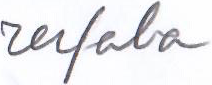чеграва
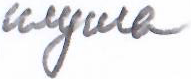клуша
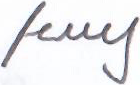ремез
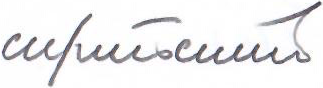сирийский
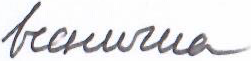весничка
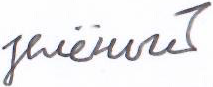зелёный
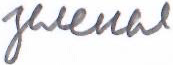зеленая
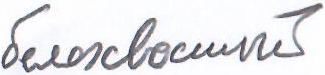белохвостый
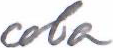сова
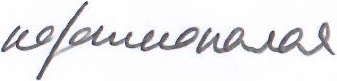короткопалая
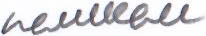пеликан
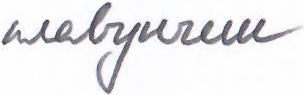плавунчик
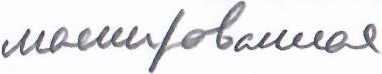маскированная
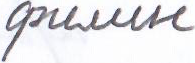филин
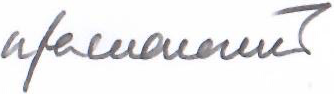красноногий
